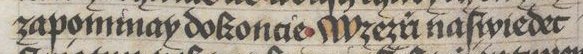zapominay dokoncie.Wzezṙi naſwiedec¬
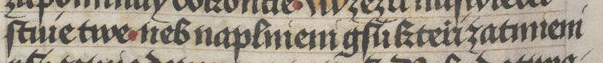ſtuíe twe.neb naplnieni gſu kteṙi zatmieni
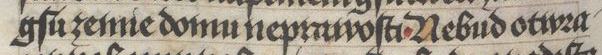gſu zemie domu neprawoſti.Nebud otwra¬
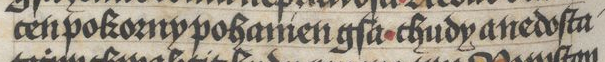cen pokorny pohaníen gſa.chudy a nedoſta¬
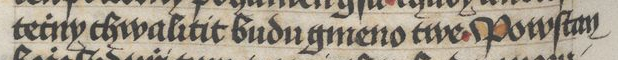teċny chwalitit budu gmeno twe.Powſtan
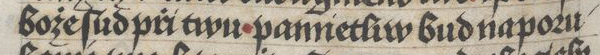boże ſud pṙi twu.pamietliw bud naporu¬
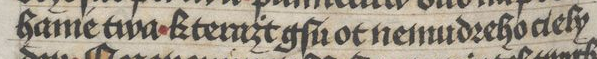hanie twa.kterażt gſu ot nemudreho ciely
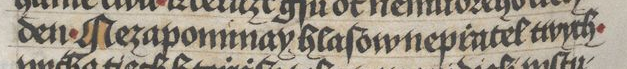den.Nezapominay hlaſow nepṙatel twych.
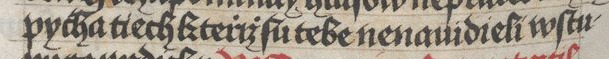pycha tiech kteṙiż ſu tebe nenawidieli wſtu¬
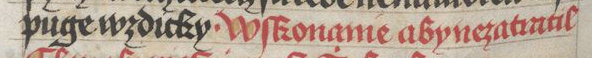puge wzdicky.Wſkonanie aby nezatratil
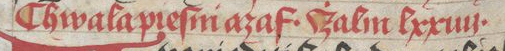Chwala pieſní azaf.Żalm lxxiiij.
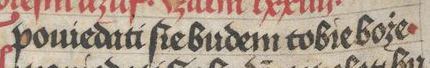pouiedati ſie budem tobie boże.
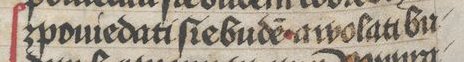zpouiedati ſie budē.a wolati bu¬
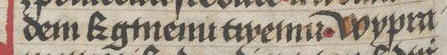dem k gmenu twemu.Wypra¬
